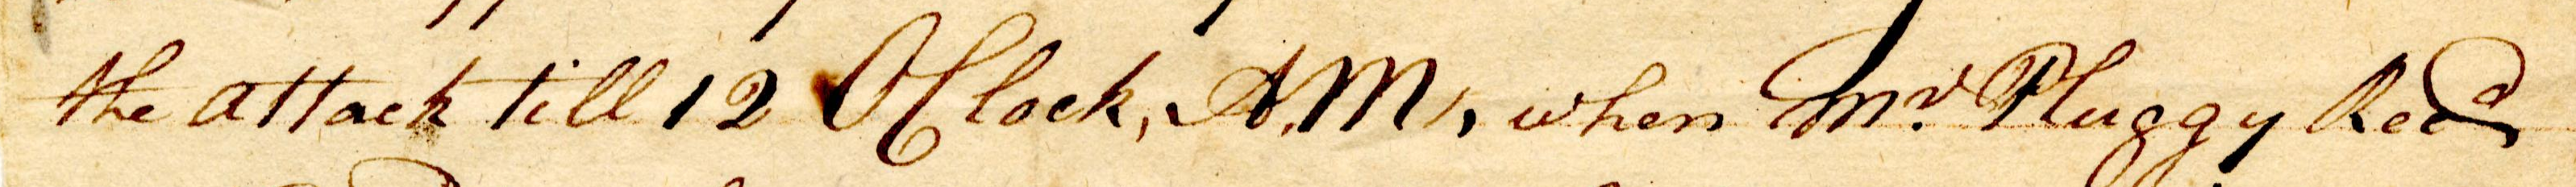the attack till 12 OClock, A.M, when M^r. Pluggy Rec^d
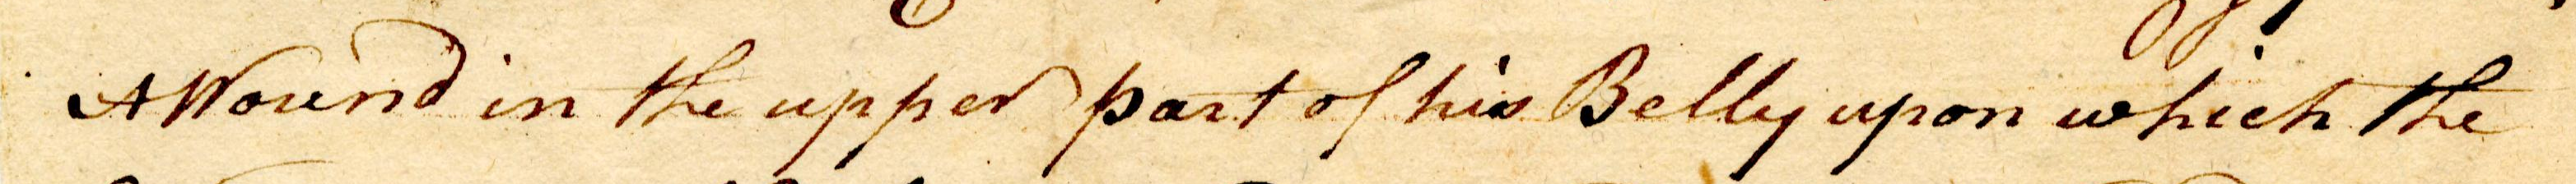A Wound in the upper part of his Belly upon which the
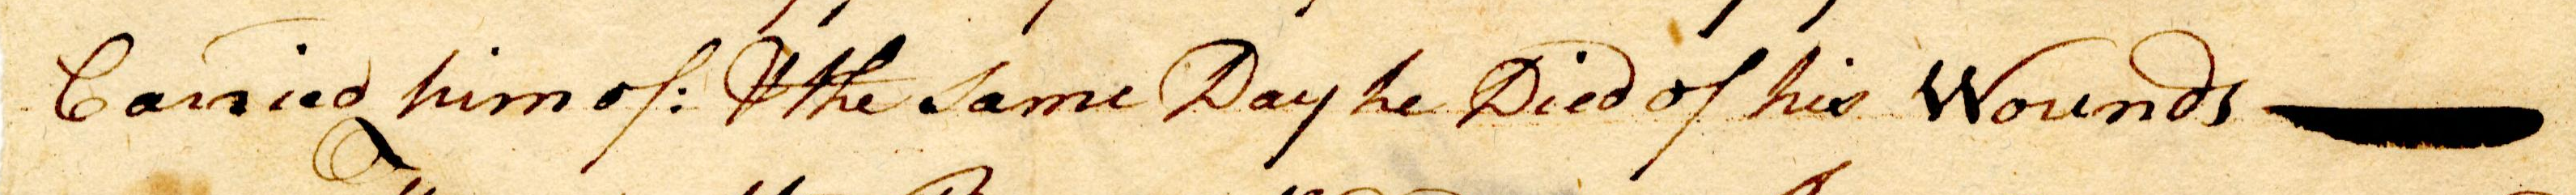Carried him of: & the same Day he Died of his Wounds-
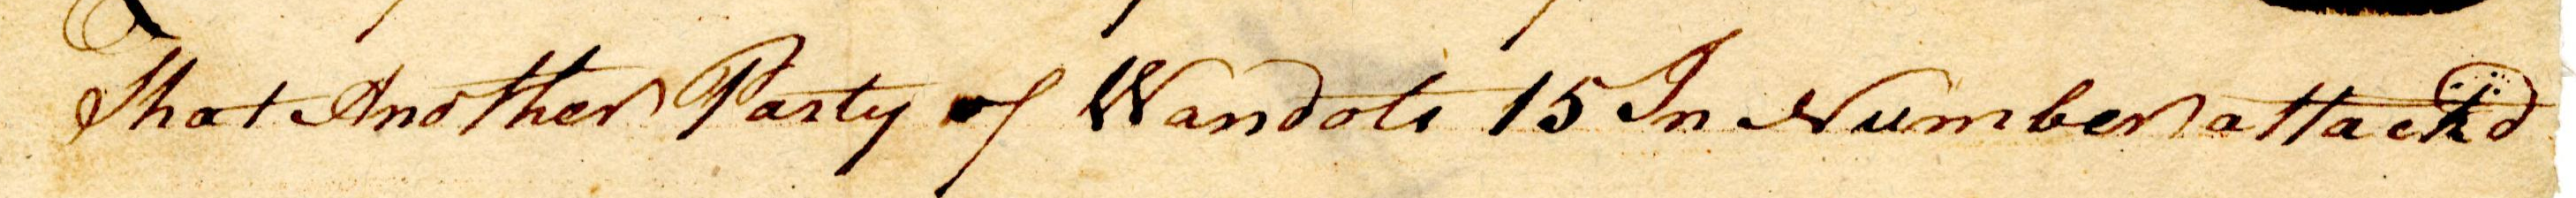That Another Party of Wandots 15 In Number attack'd
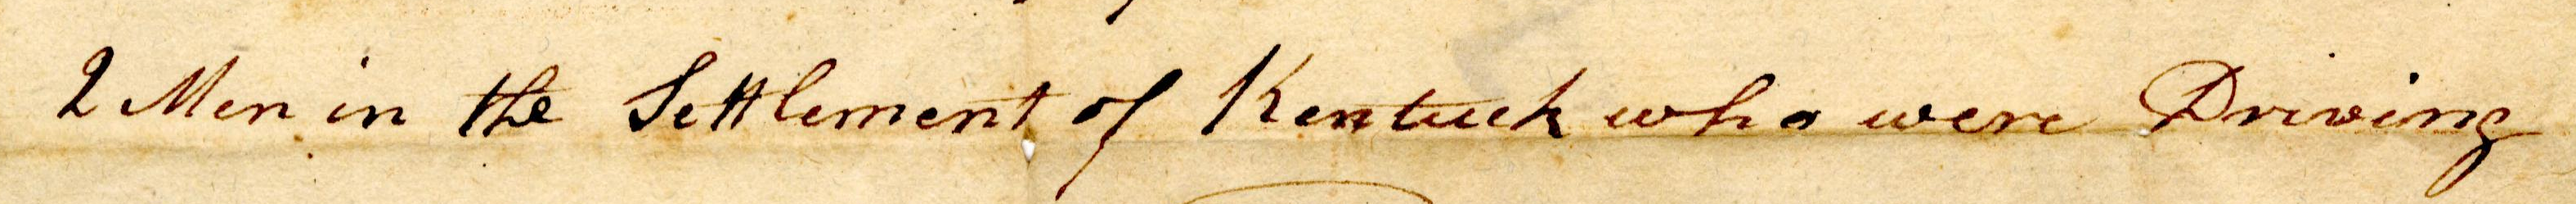2 Men in the Settlement of Kentuck who were Driving
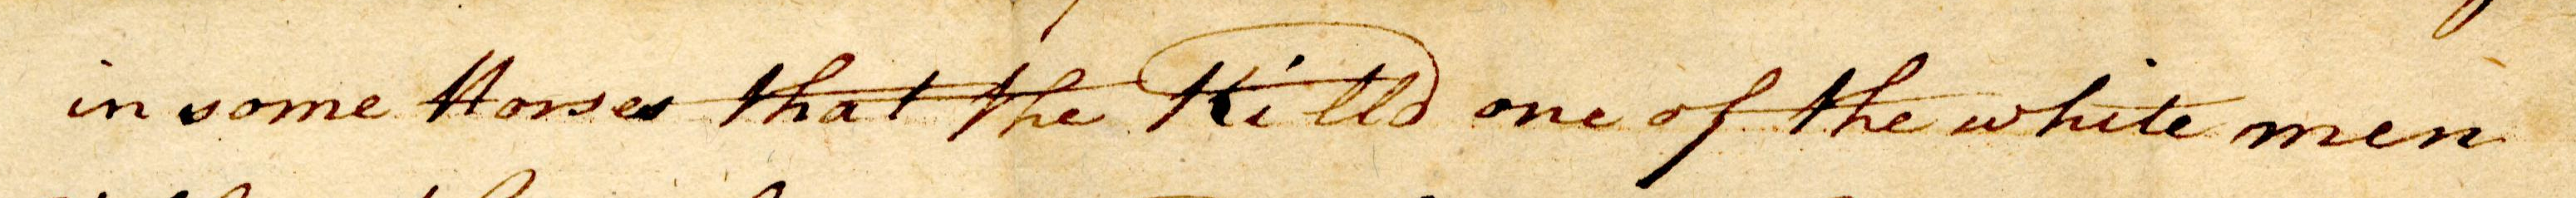in some Horses that the Killd one of the white men
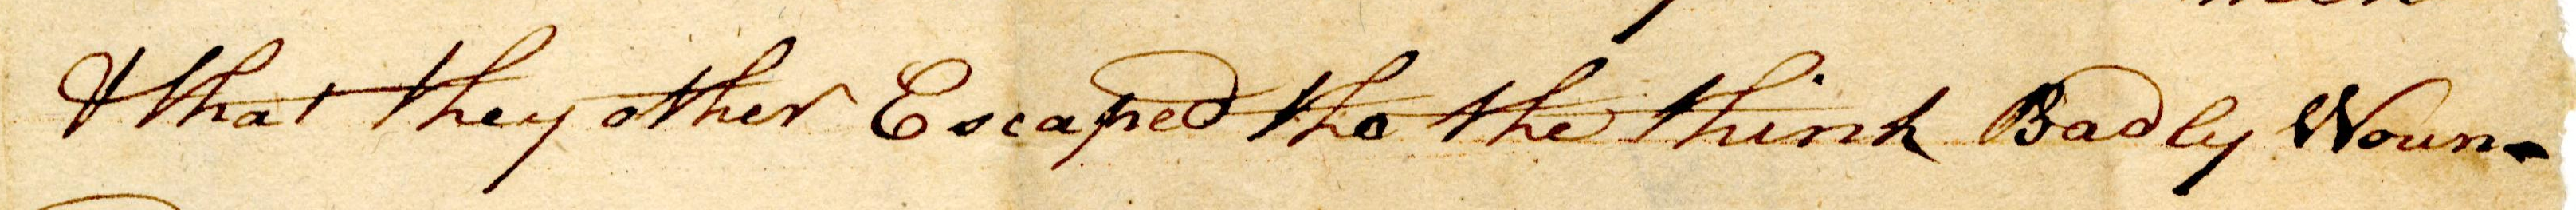& that they other Escaped tho the think Badly Woun-
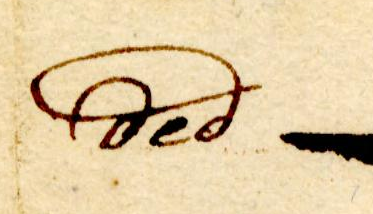ded-
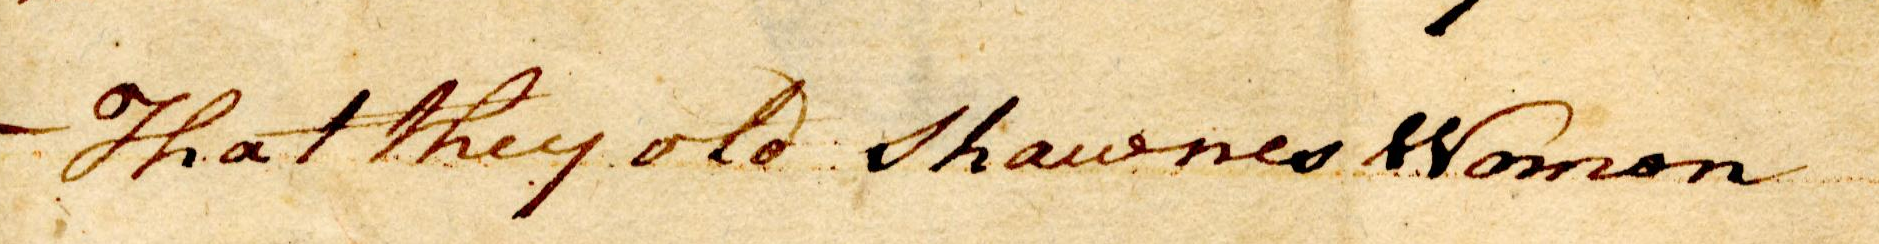That they old Shawnes Woman
